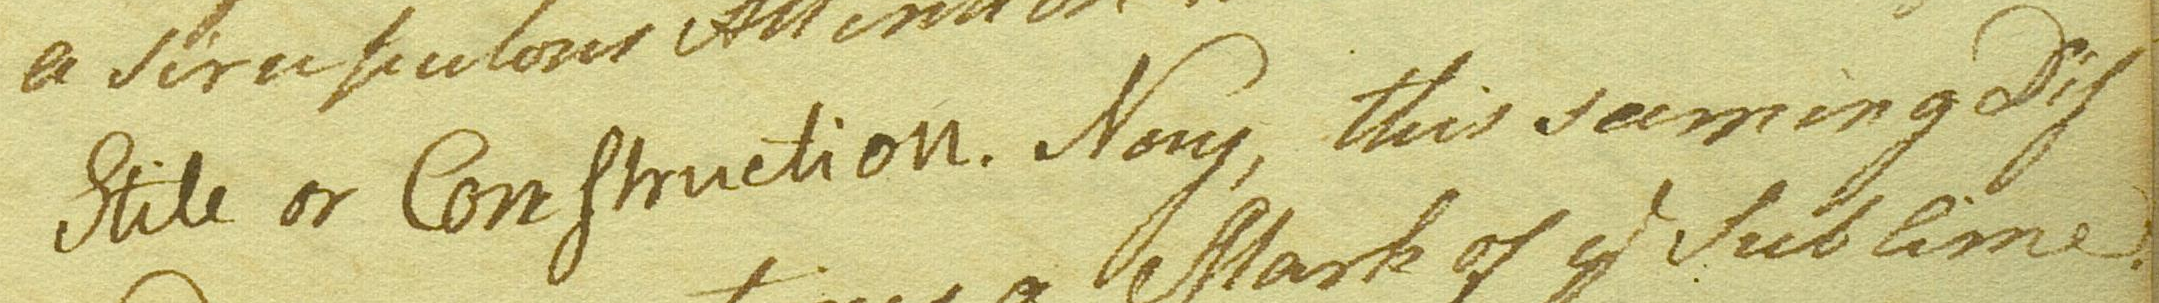Stile or Construction. Nay, this seeming Dis
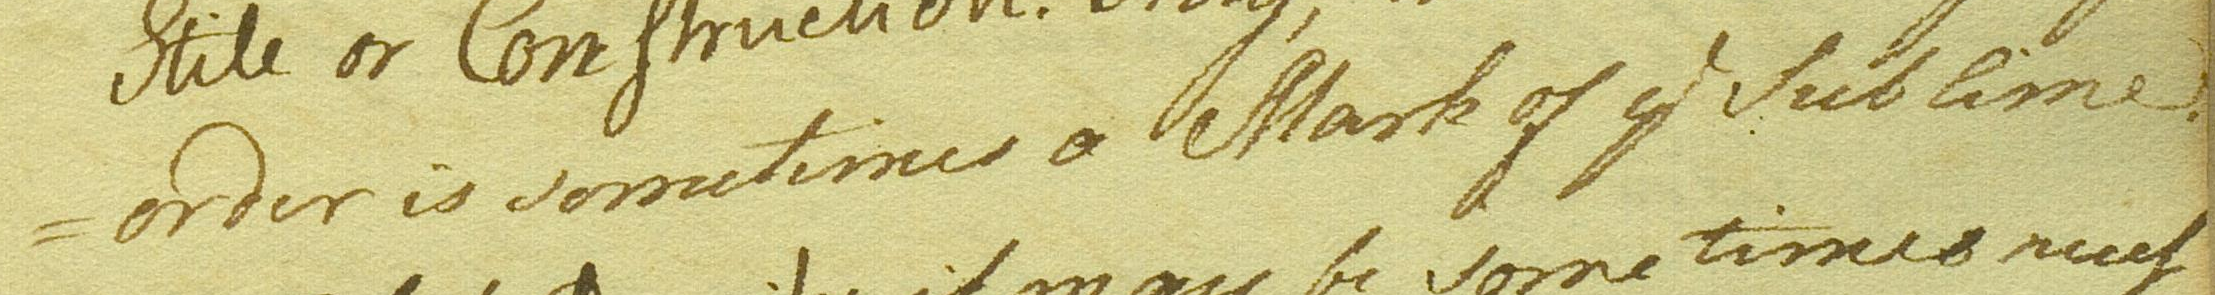-order is sometimes a Mark of y^e Sublime.
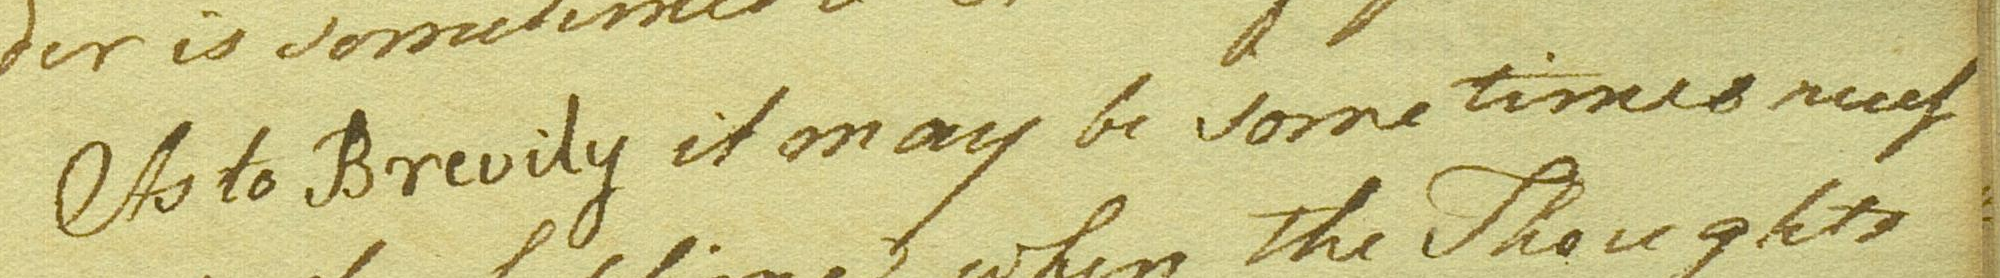As to Brevity it may be sometimes neces
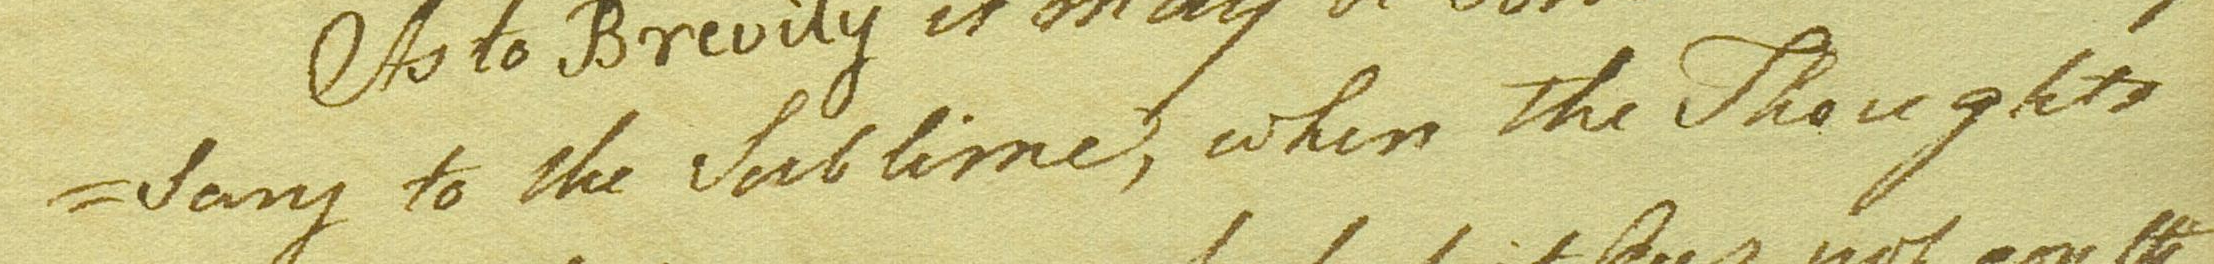-sary to the Sublime, when the Thoughts
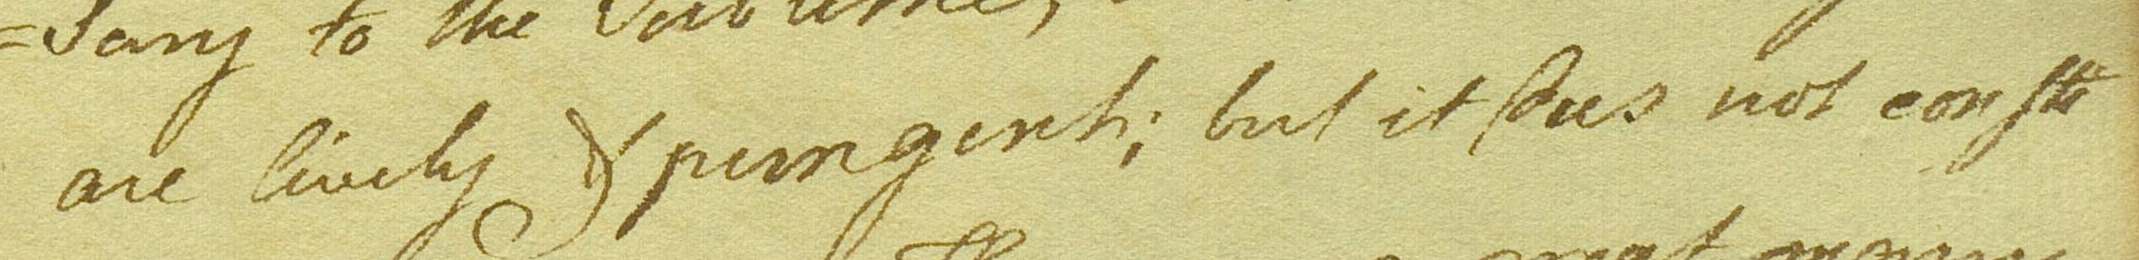are lively & pungent; but it does not consti
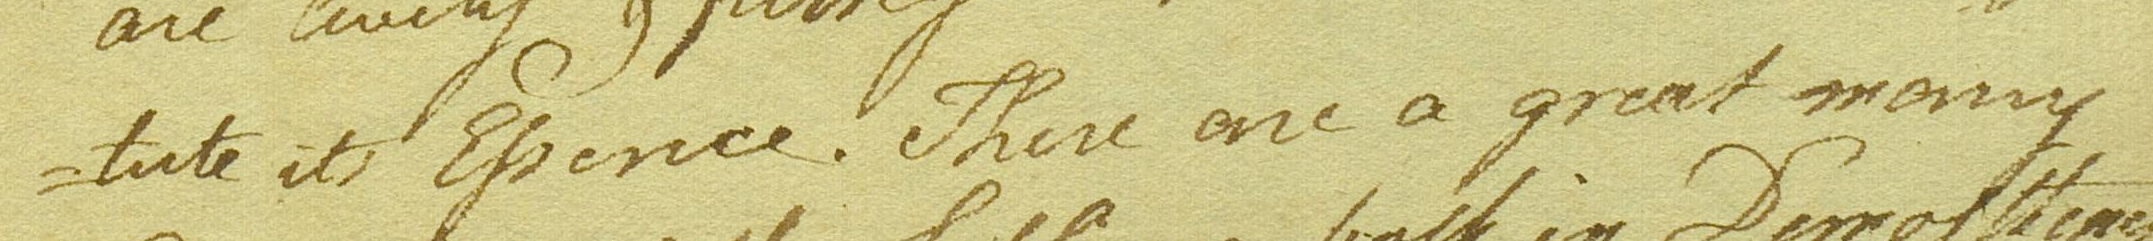-tute its Essence. There are a great many
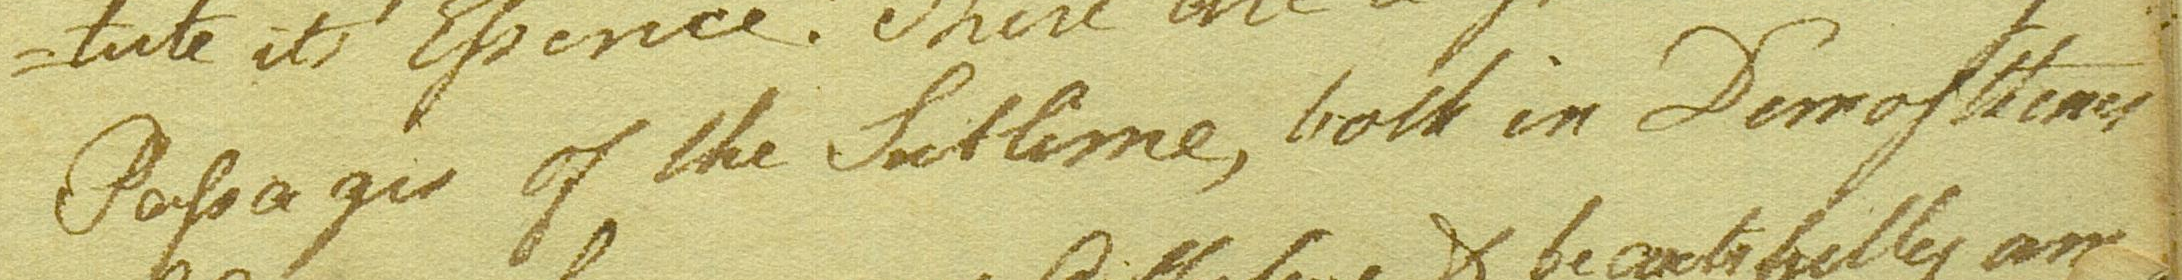Passages of the Sublime, both in Demosthenes
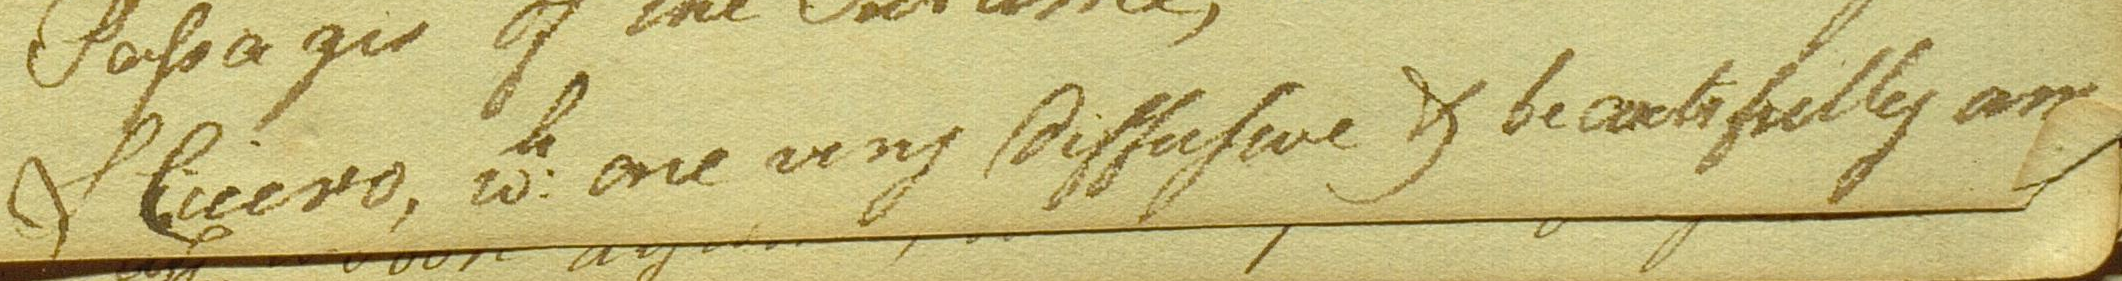& Cicero, w^h are very diffusive & beautifully ar
